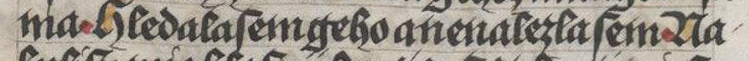ma.Hledala em geho a nenalezla ſem. Na¬
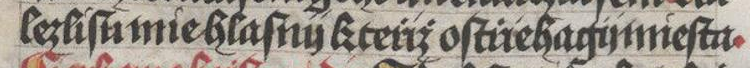lezli ſu míe hlaſnij kteṙíż oſtṙíehagij mieſta.
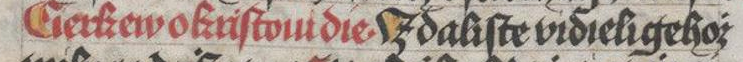Cierkew o kriſtoui die.Zdaliſte vidieligehoż
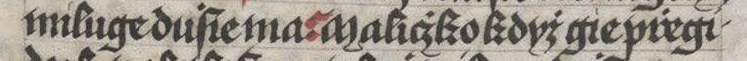miluge duẛíe ma?Malicżko kdyż gie pṙegi¬
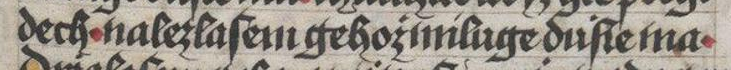dech.nalezlaſem gehoż miluge duẛie ma.
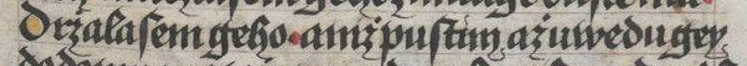Drżalaſem geho.aniż puſtim ażuwedu gey
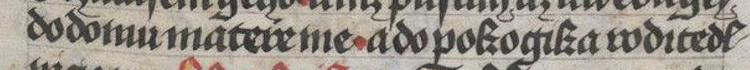dodomu mateṙe me.a do pokogika roditedl¬
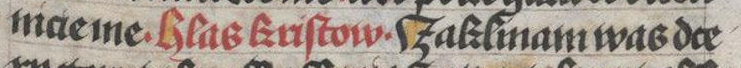nicie me.Hlas kriſtow.Zaklínam was dce¬
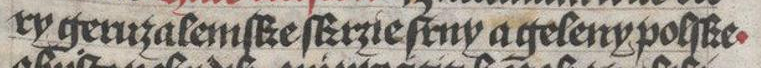ry geruzalemſke ſkrzie ſrny a geleny polſke.
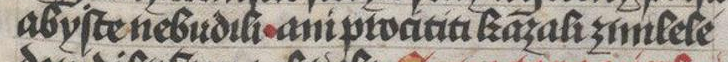abyẛte nebudili.ani procítiti kazali zmilelé
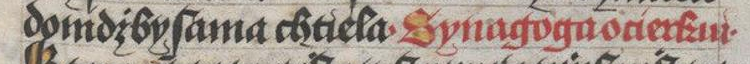donidżby ſama chtiela.Synagoga ocíerkui.
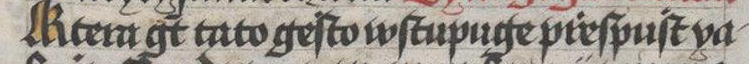Ktera ḡt tato geẛto wſtupuge pṙeſpuẛt ya¬
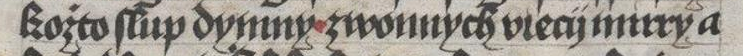kożto ſlup dymny.zwonnych viecij mirrry a
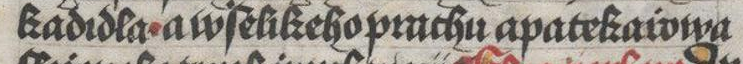kadidla.a wẛelikeho prachu apatekaṙowa
